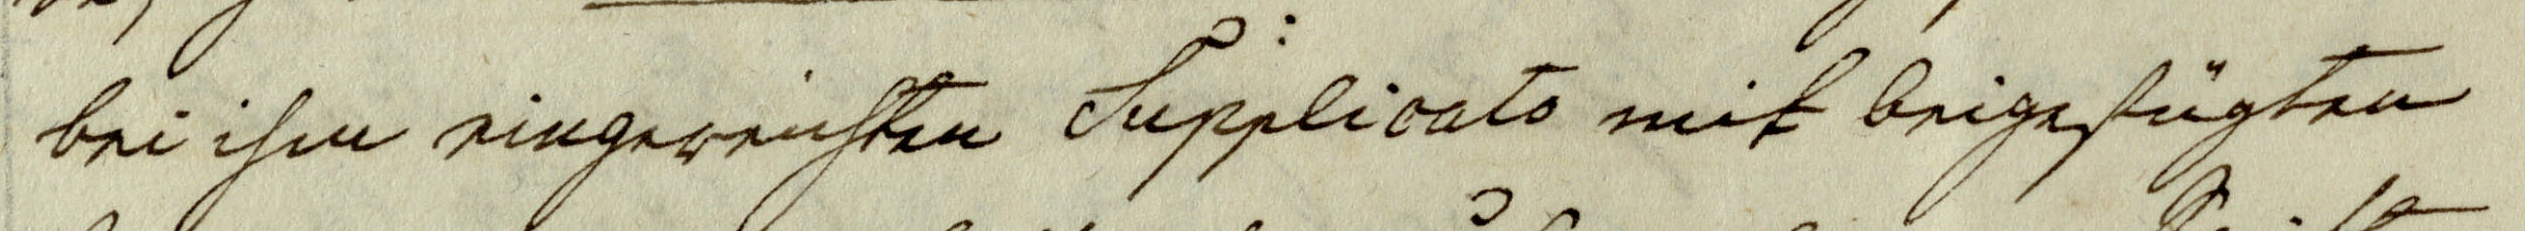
bei ihm eingereichten Supplicato mit beigefügten
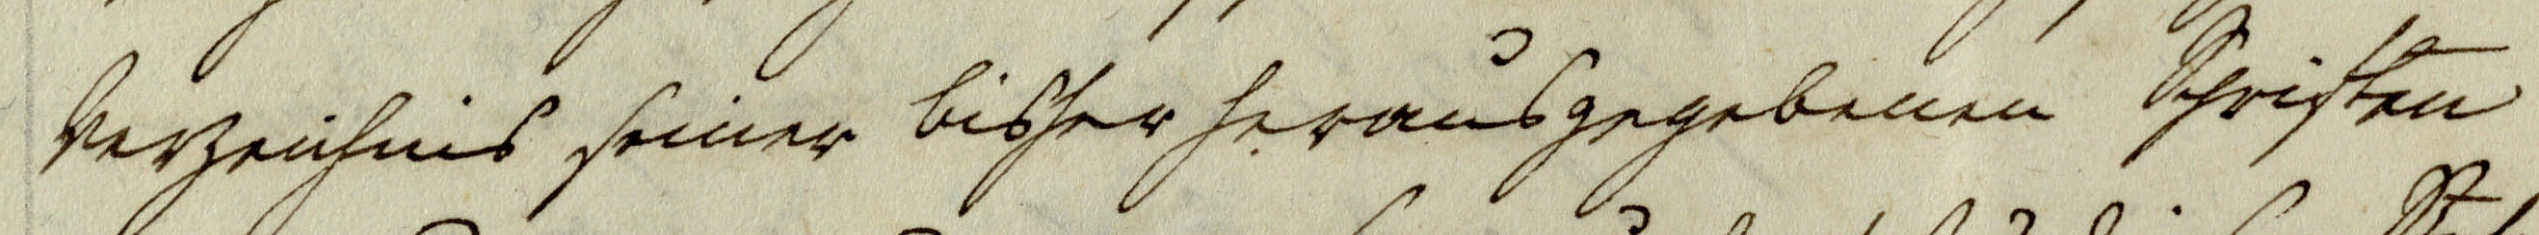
Verzeichnis seiner Bisher herausgegebenen Schriften
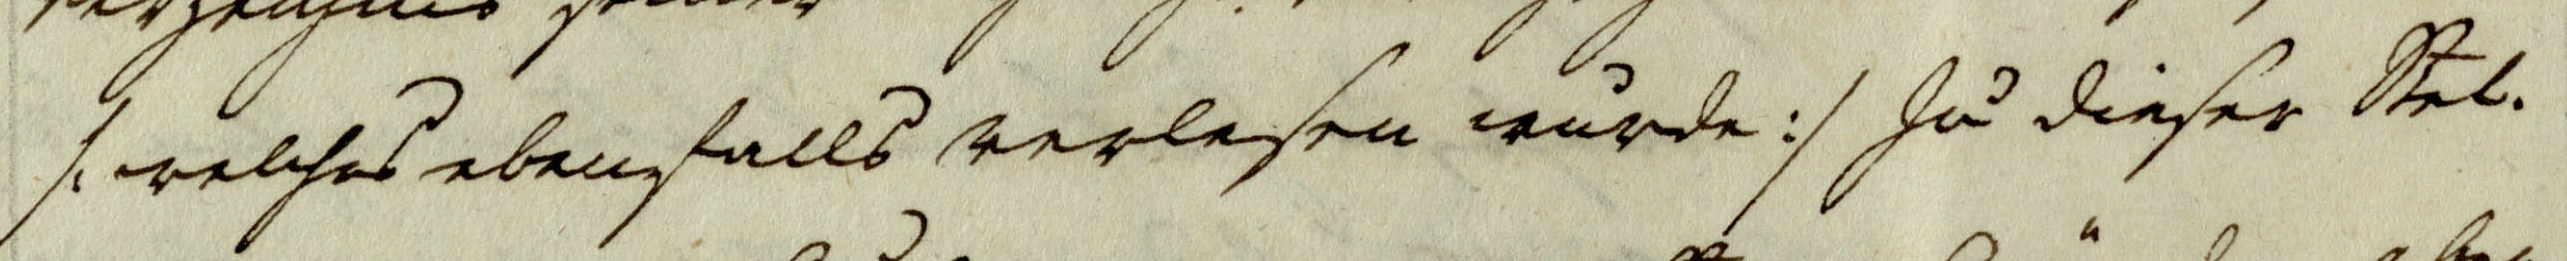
/: welches ebenfalls verlesen wurde :/ zu dieser Stel¬
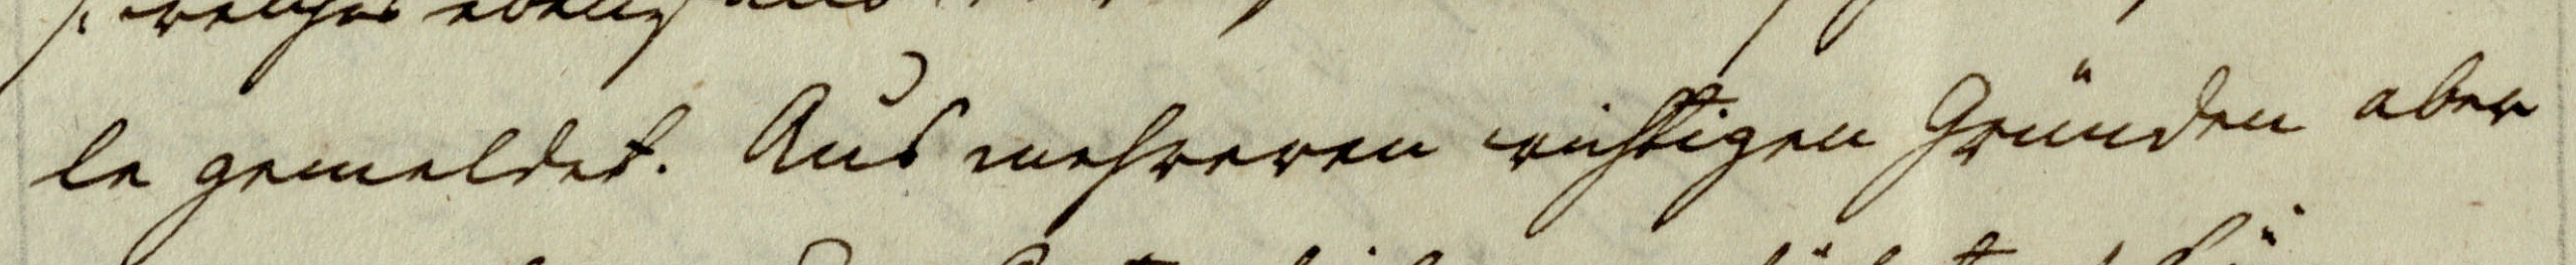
le gemeldet. Aus mehreren richtigen Gründen aber
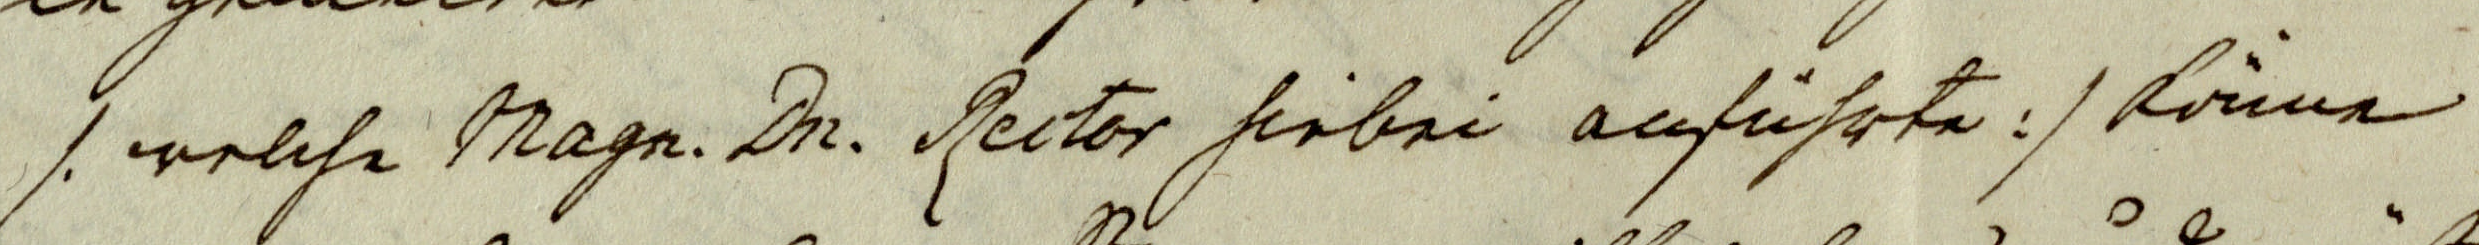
/: welche Magn. Dn. Rector hiebei anführte :/ könne
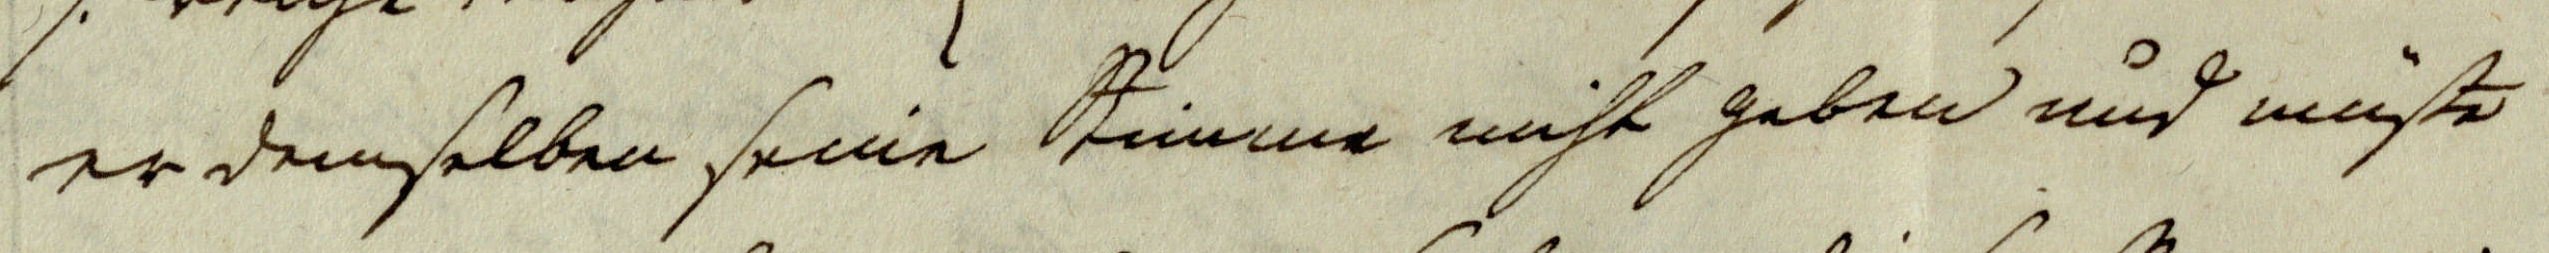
er demselben seine Stimme nicht geben und müßte
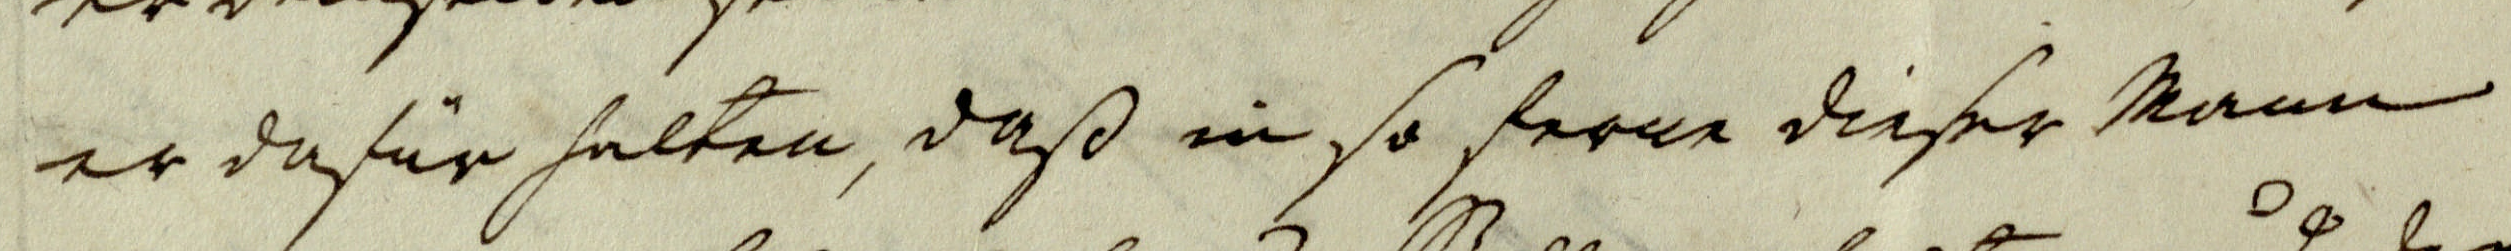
er dafür halten, daß in so ferne dieser Mann
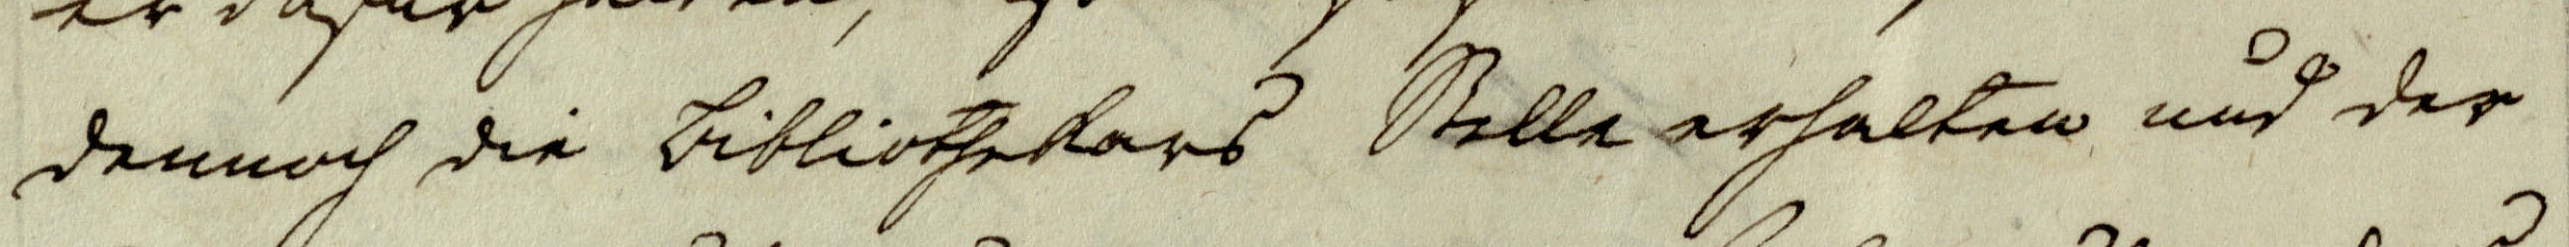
dennoch die Bibliothekars Stelle erhalten und der
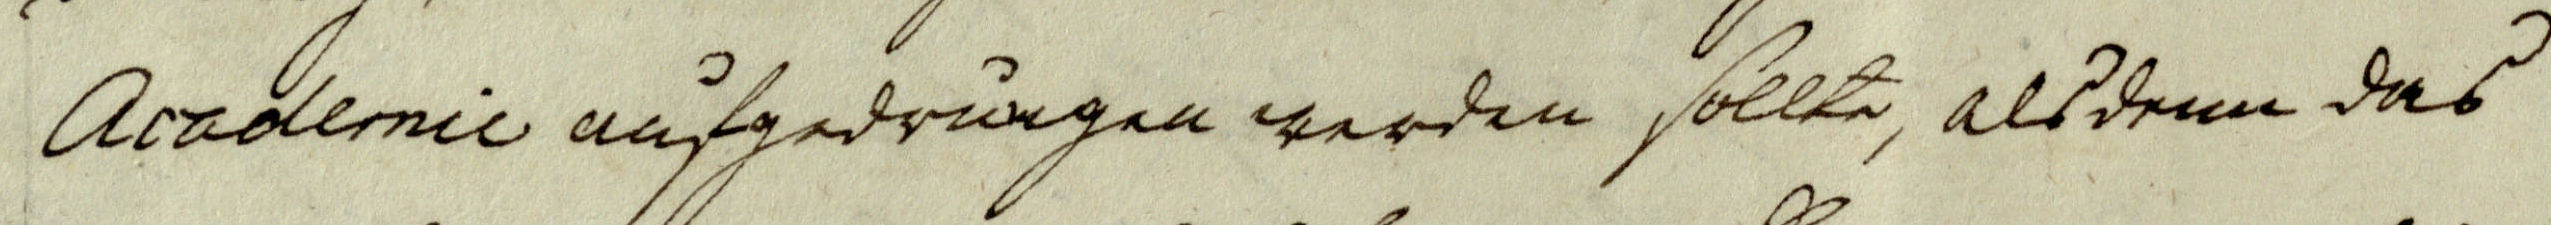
Academie aufgedrungen werden sollte, alsdenn das
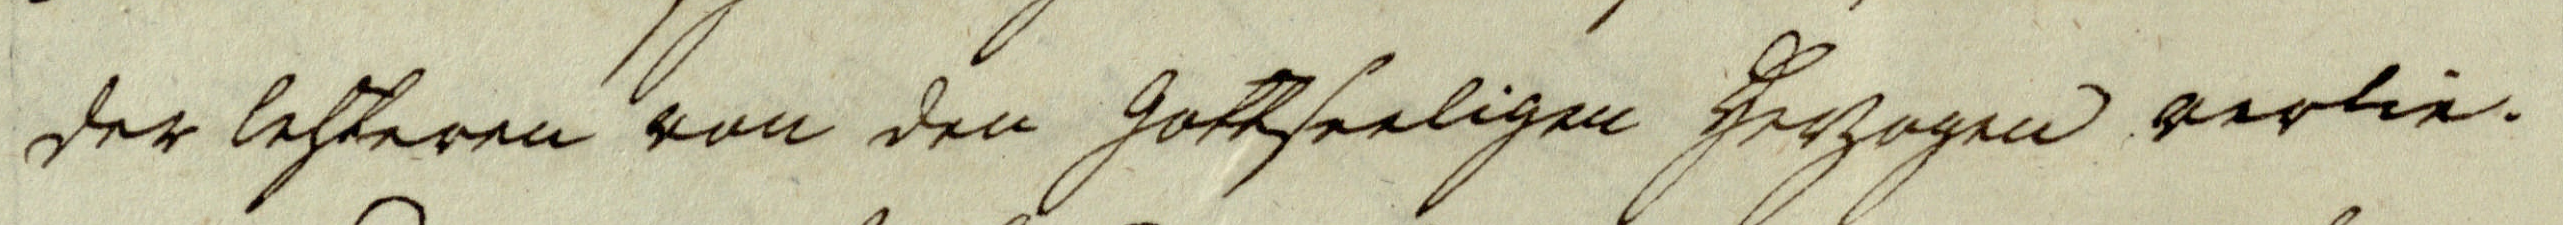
der letzteren von den Gottseeligen Herzogen verlie¬
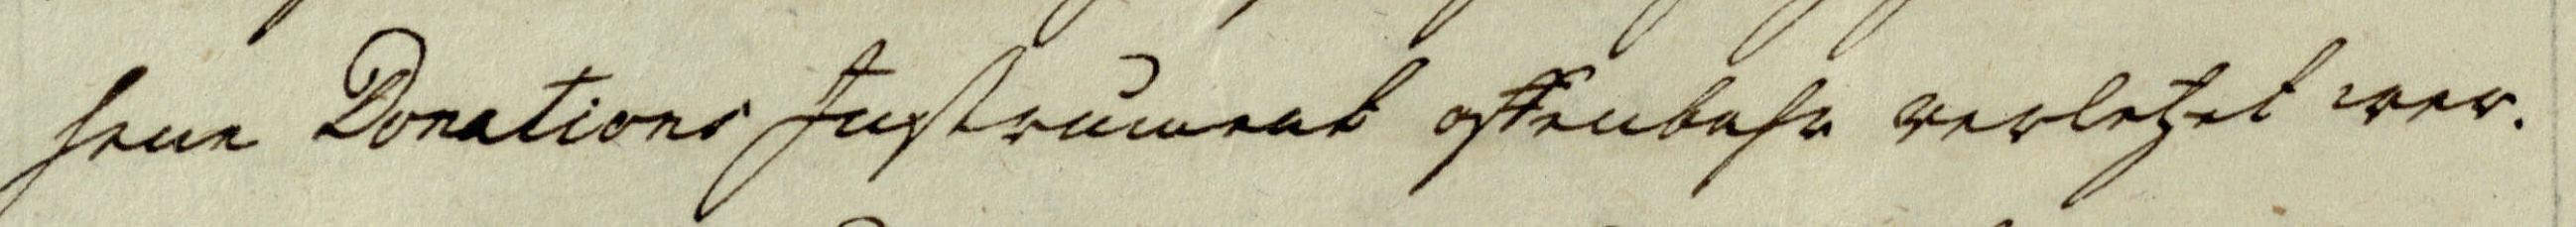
hene Donations Instrument offenbahr verletzt wer¬
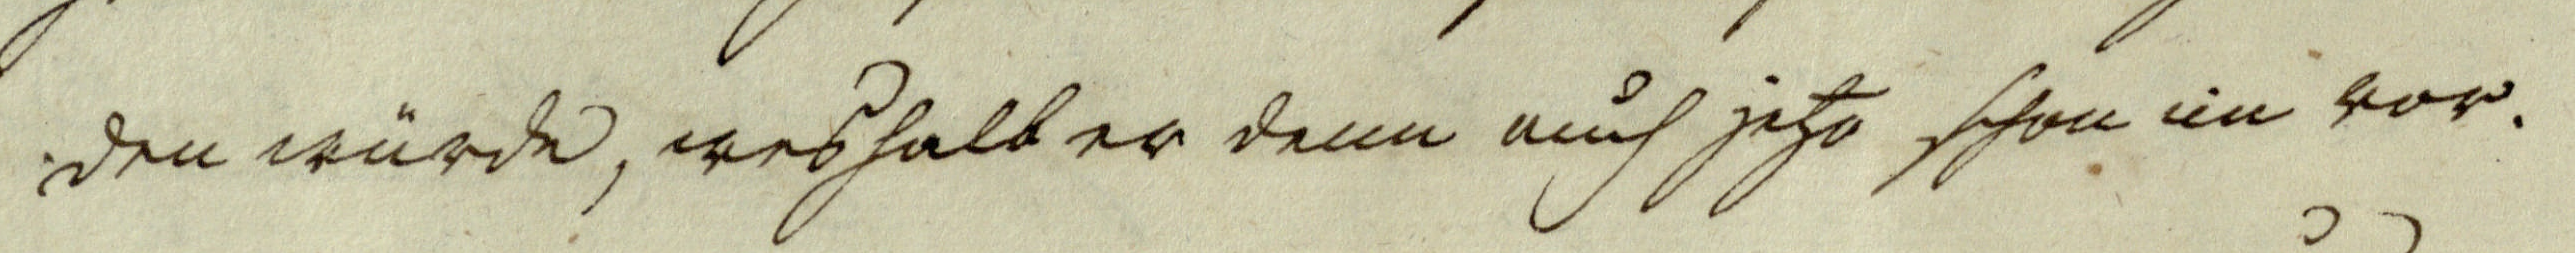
den würde, weshalb er denn auch jetzo schon im vor¬
